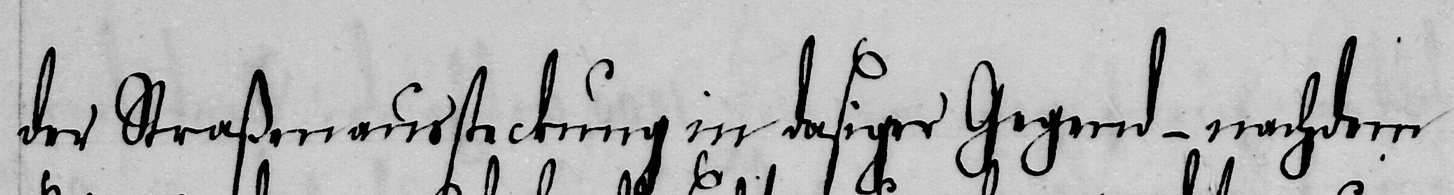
der Straßenaussteckung in dasiger Gegend – nachdem
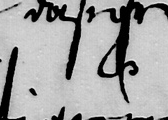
19.
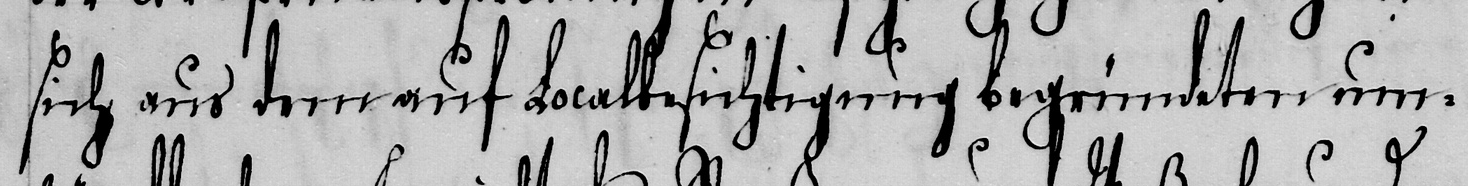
sich aus dem auf Localbesichtigung begründeten um¬
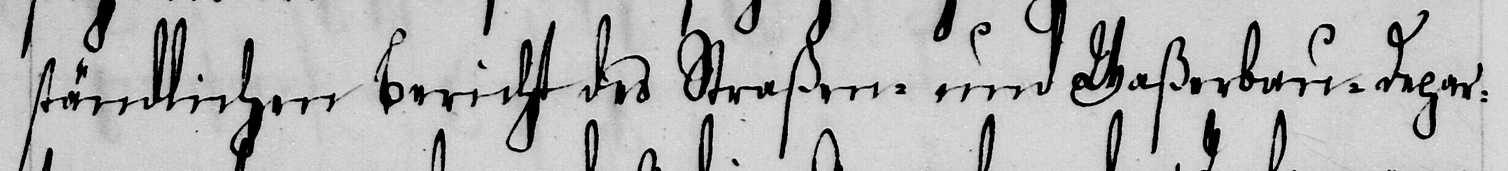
ständlichen Bericht des Straßen- und Waßerbau-Depar¬
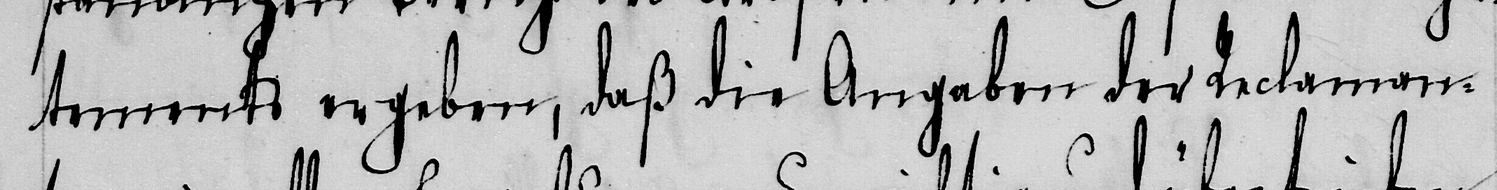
tements ergeben, daß die Angaben der Reclaman¬
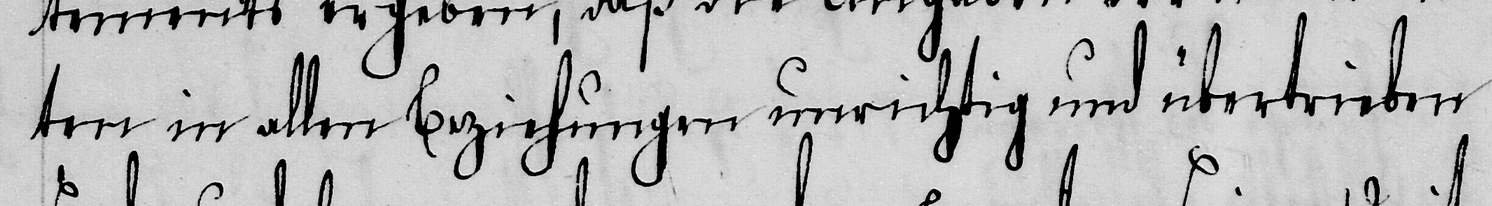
ten in allen Beziehungen unrichtig und übertrieben
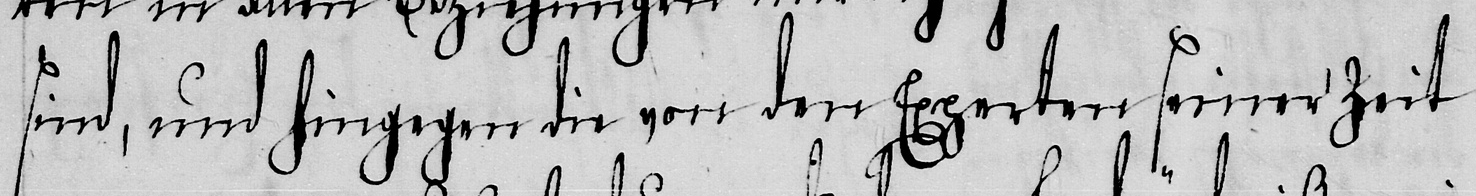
sind, und hingegen die von den Experten seiner Zeit
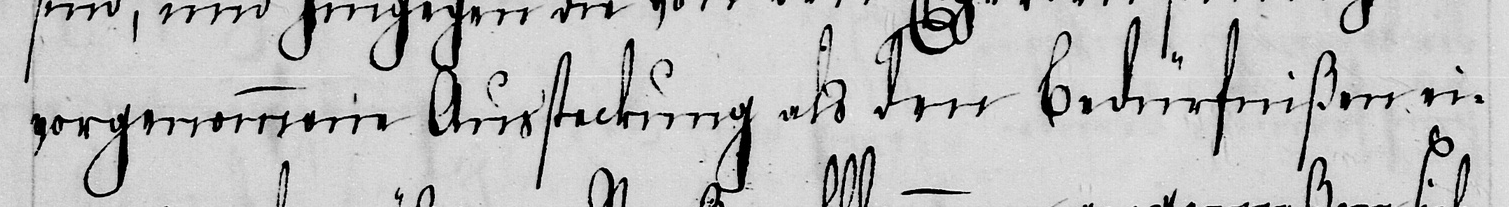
vorgenommene Aussteckung als den Bedürfnißen ei¬
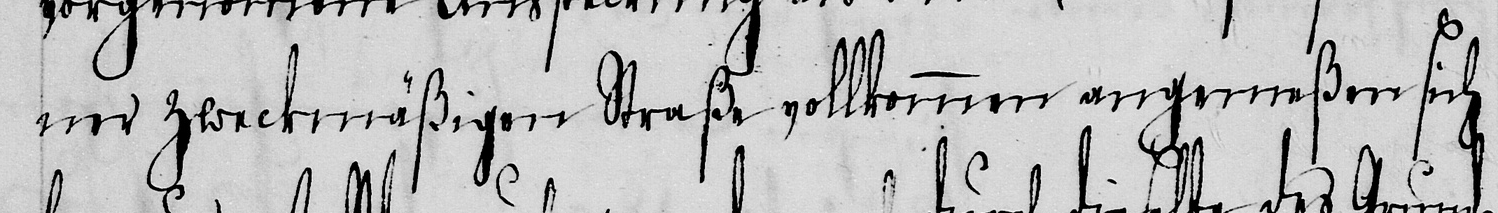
ner zweckmäßigen Straße vollkommen angemeßen sich
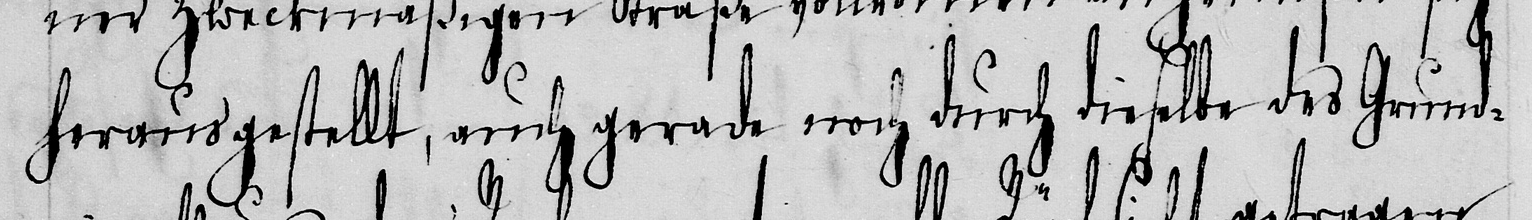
herausgestellt, auch gerade noch durch dieselbe des Grund¬
